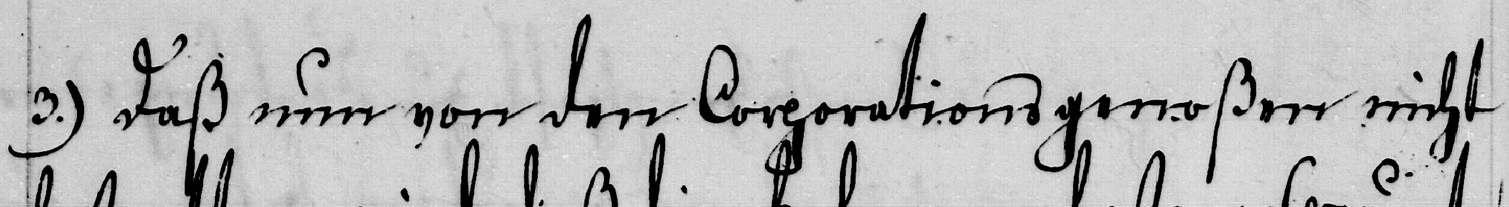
3.) Daß nun von den Corporationsgenoßen nicht
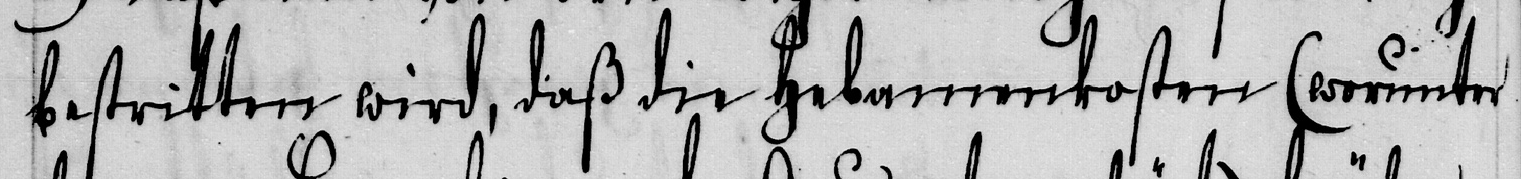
bestritten wird, daß die Hebamenkosten (worunter
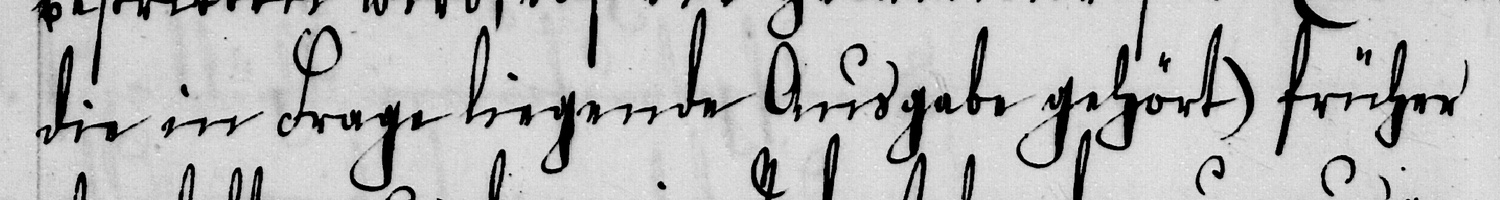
die in Frage liegende Ausgabe gehört) früher
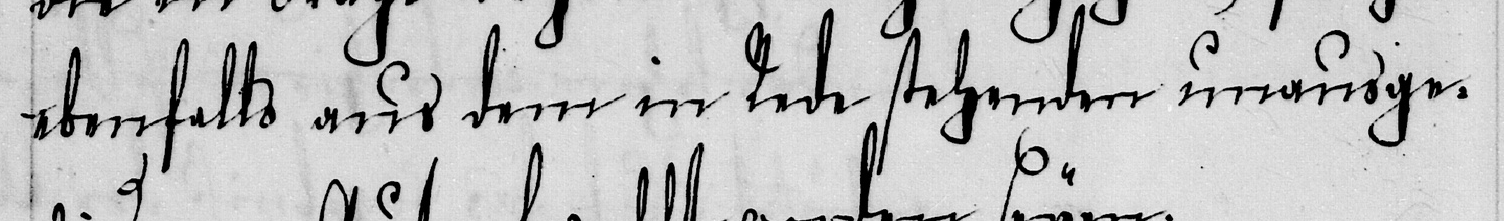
ebenfalls aus dem in Rede stehenden unausge¬
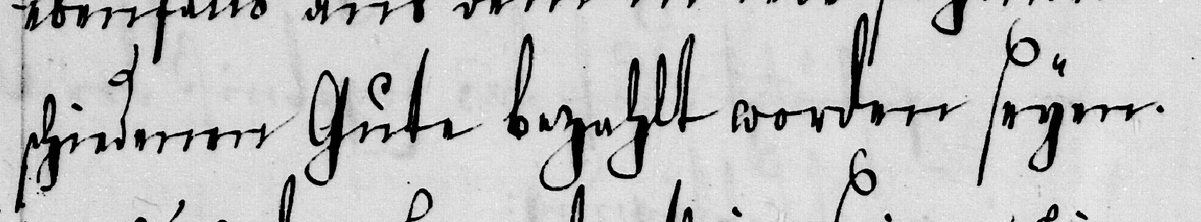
schiedenen Gute bezahlt worden seyen.
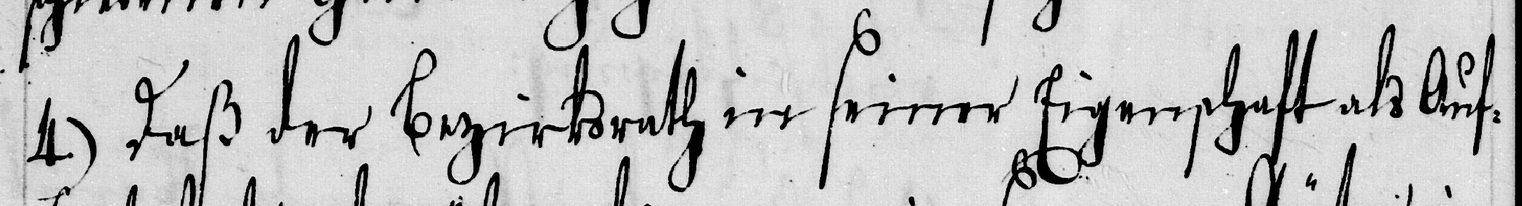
4.) Daß der Bezirksrath in seiner Eigenschaft als Auf¬
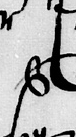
1.)
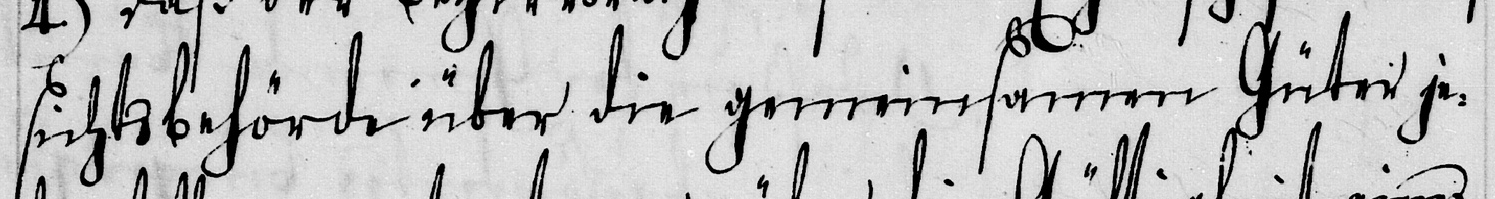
sichtsbehörde über die gemeinsamen Güter je¬
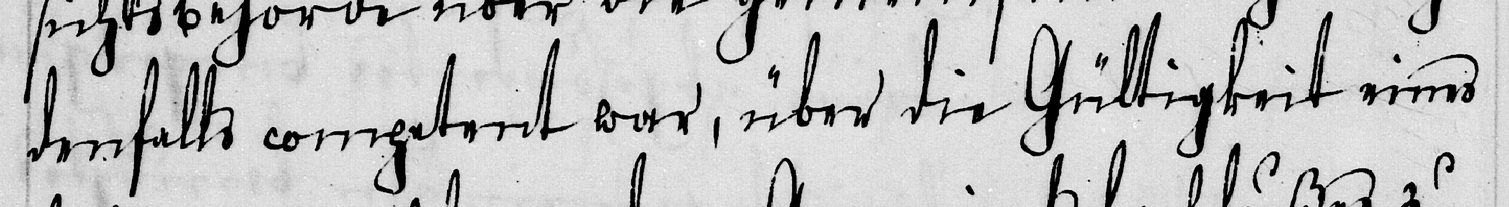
denfalls competent war, über die Gültigkeit eines
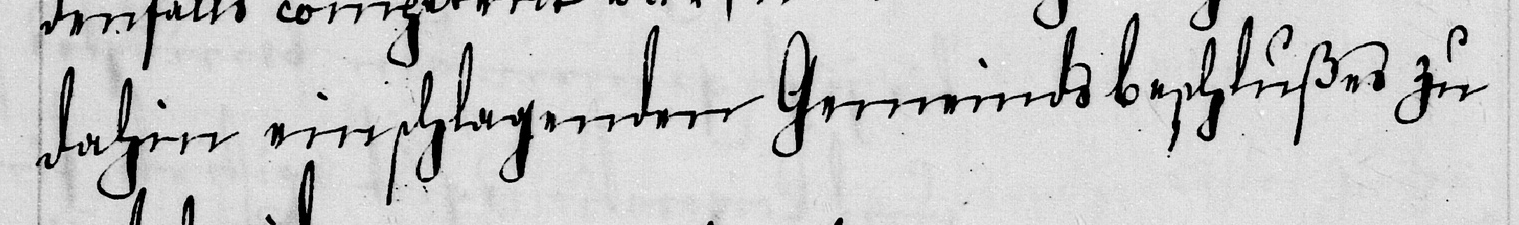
dahin einschlagenden Gemeindsbeschlußes zu
